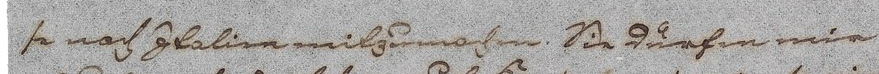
se nach Italien mitzumachen. Sie dürfen mir
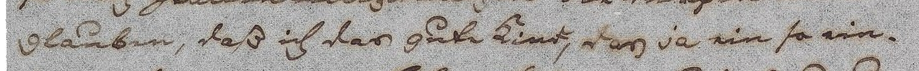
glauben, daß ich das gute Kind, das ja ein so ein-
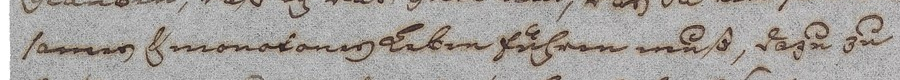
sames & monotones Leben führen muß, dazu zu
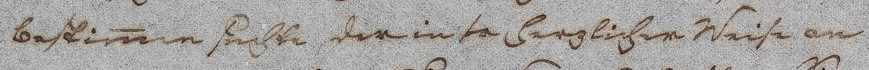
bestimmen suchte, der in so herzlicher Weise an
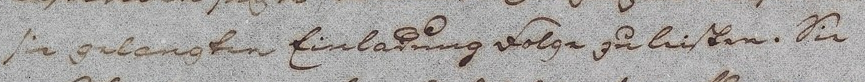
sie gelangten Einladung Folge zu leisten. Sie
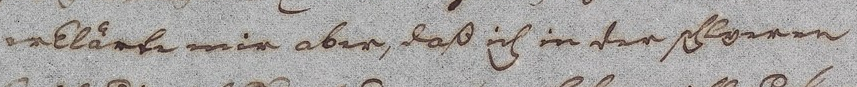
erklärte mir aber, daß ich in der schweren
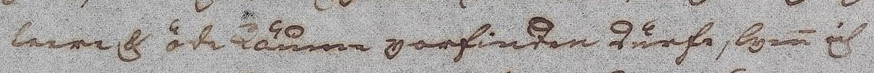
leere & öde Räume vorfinden dürfe, wenn ich
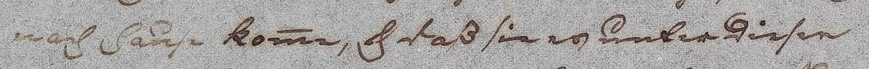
nach Hause komme, & daß sie es unter diesen
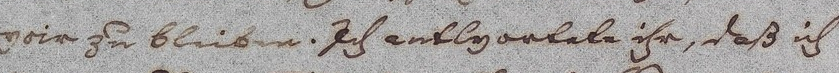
voir zu bleiben. Ich antwortete ihr, daß ich
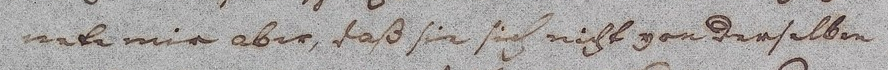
nete mir aber, daß sie sich nicht von derselben
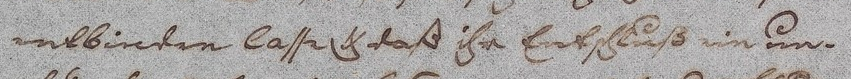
entbinden lasse & daß ihr Entschluss ein un-
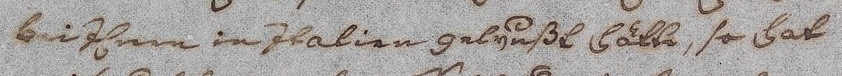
bei Ihnen in Italien gewußt hätte, so hat
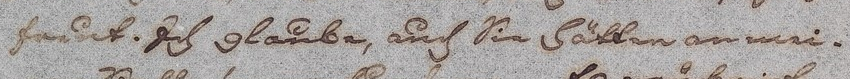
freut. Ich glaube, auch Sie hätten an mei-
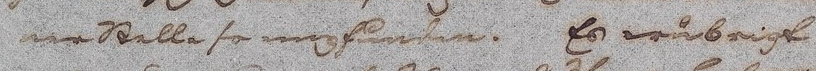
ner Stelle so empfunden. Es erübrigt
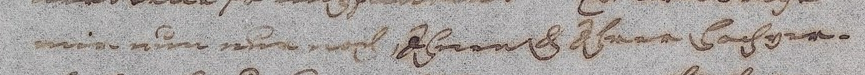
mir nun nur noch, Ihnen & Ihrer hochver-
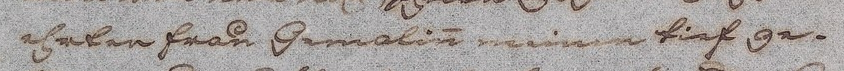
ehrten Frau Gemalinn meinen tief ge-
